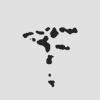不
